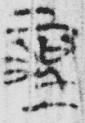聖（聲）
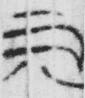而
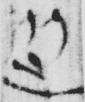從
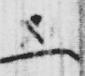之
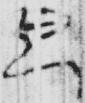也
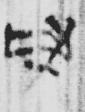凡
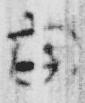古
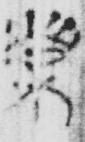樂
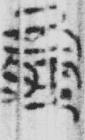壟
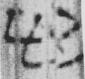心
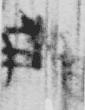益
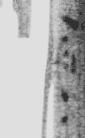壟
